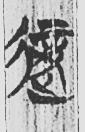復
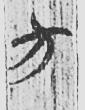方
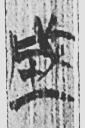城
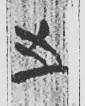之
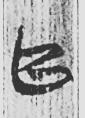𠂤
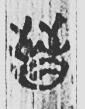晉
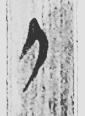人
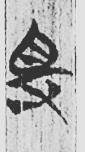{且又}
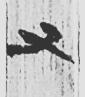又
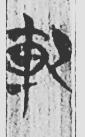{車㔾}
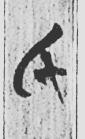氏
